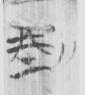型
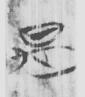是
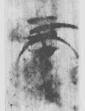不
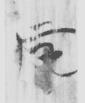厇
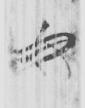母
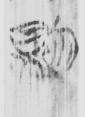則
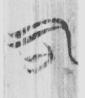司
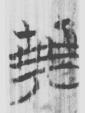典
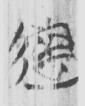{止達}
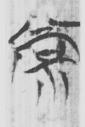常
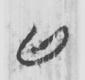㠯（以）
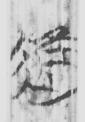進
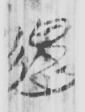退
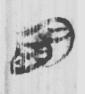{甶月}
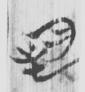朔
